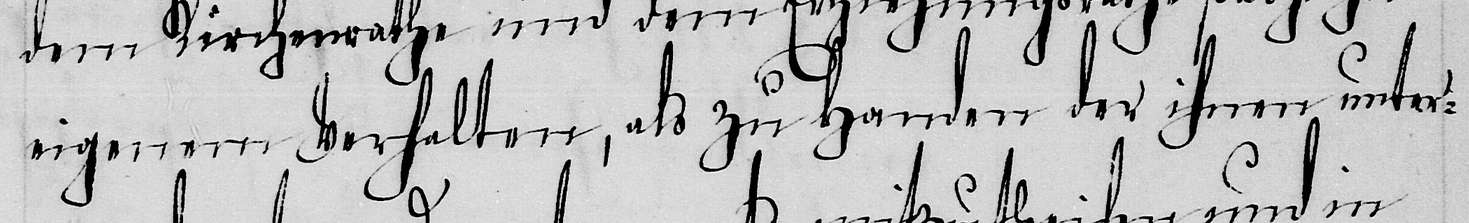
eigenem Verhalten, als zu Handen der ihnen unter¬
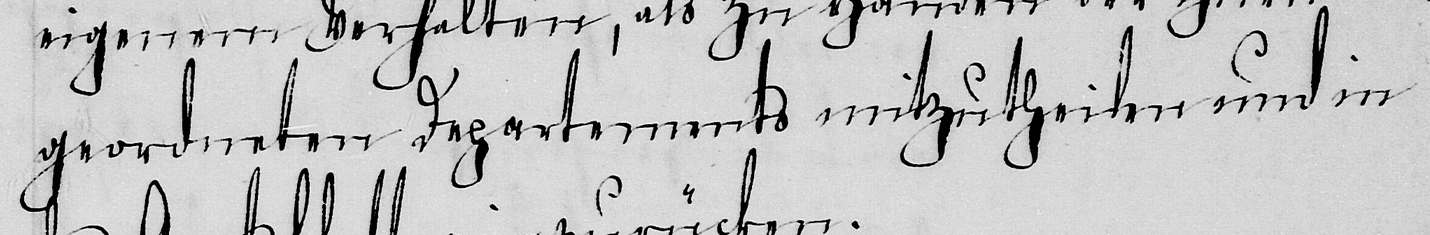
geordneten Departements mitzutheilen und in
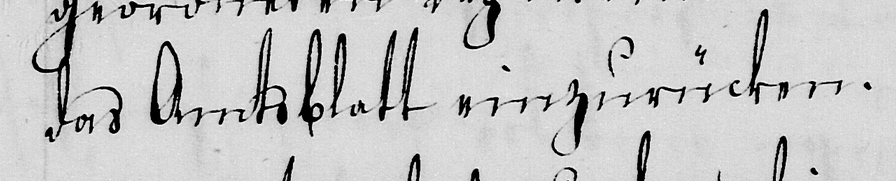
das Amtsblatt einzurücken.
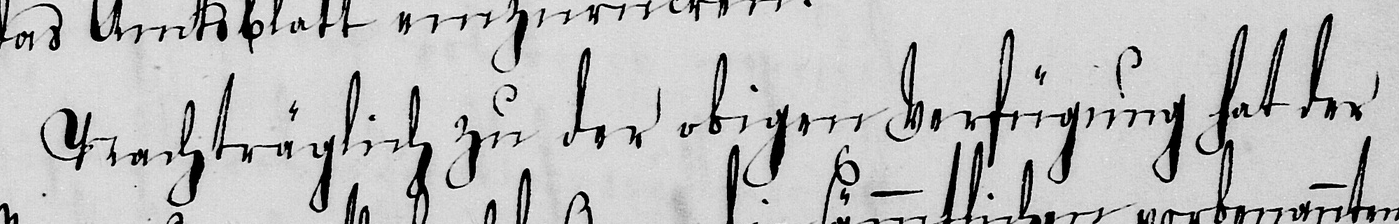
Nachträglich zu der obigen Verfügung hat der
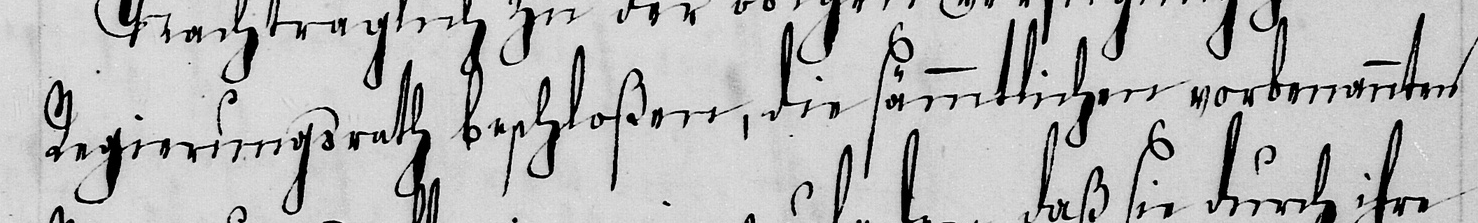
Regierungsrath beschloßen, die sämmtlichen vorbenannten
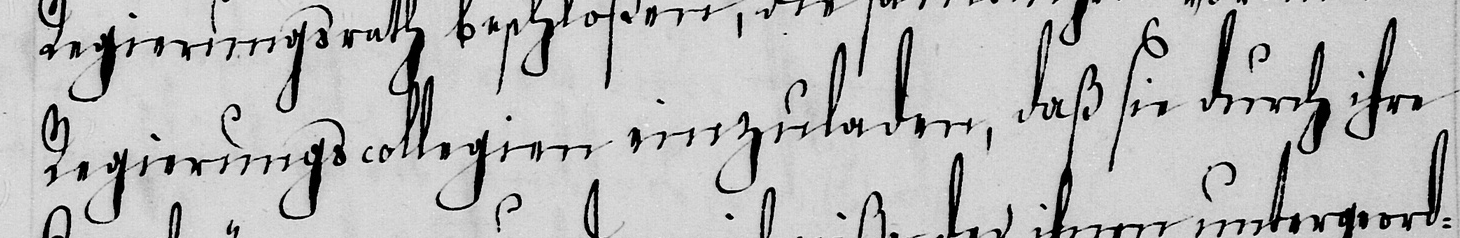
Regierungscollegien einzuladen, daß sie durch ihre
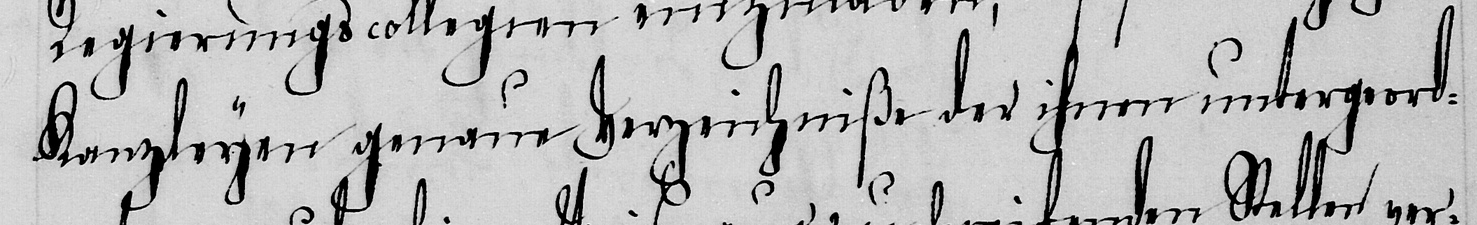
Kanzleyen genaue Verzeichniße der ihnen untergeord¬
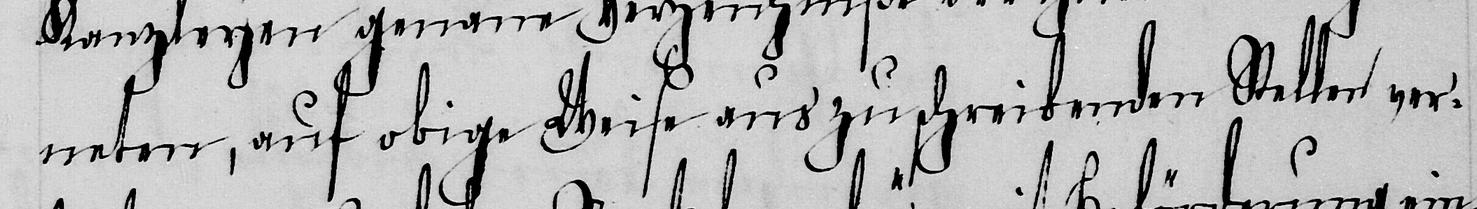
neten, auf obige Weise auszuschreibenden Stellen ver¬
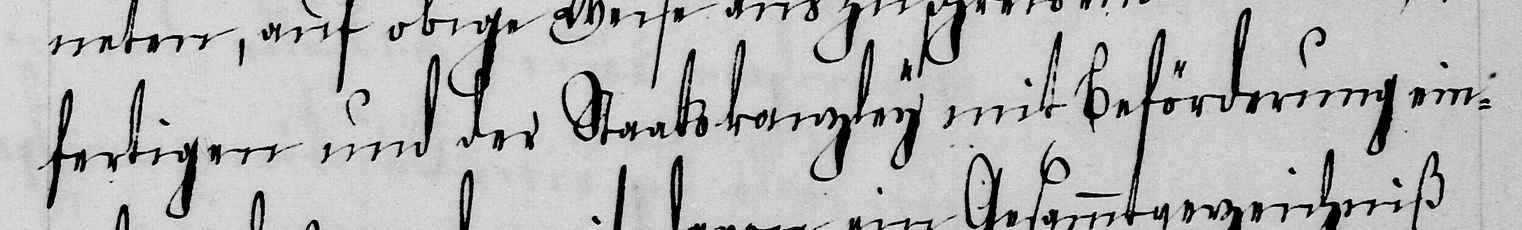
fertigen und der Staatskanzley mit Beförderung ein¬
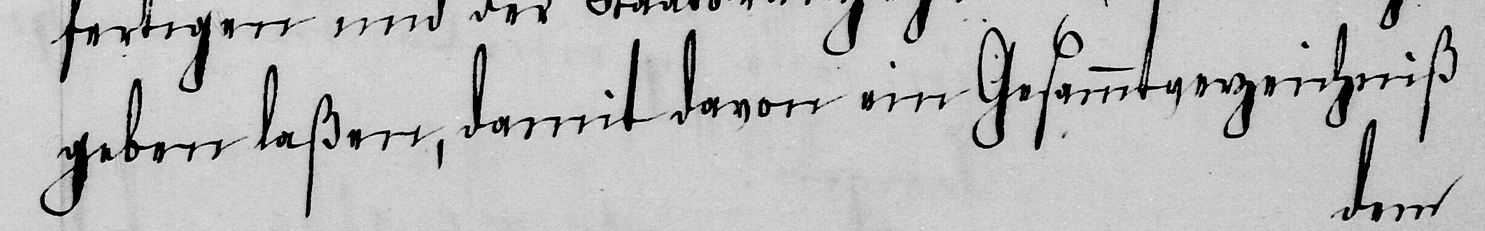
geben laßen, damit davon ein Gesammtverzeichniß
